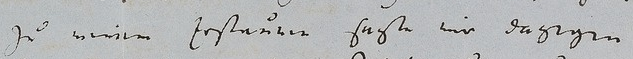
Zu meinem Erstaunen sagte mir dagegen
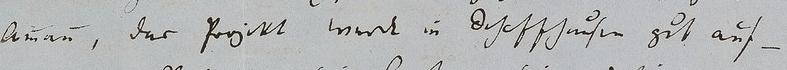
Ammann, das Projekt werde in Schaffhausen gut auf-
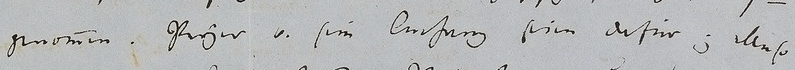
genommen. Peyer &. sein Anhang seien dafür; ebenso
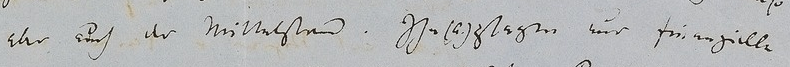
aber auch der Mittelstand. Ihn (A.) plagen nur finanzielle
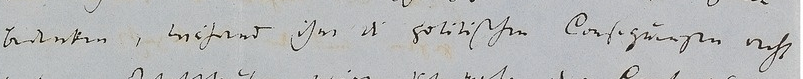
Bedenken, während ihm die politischen Consequenzen recht
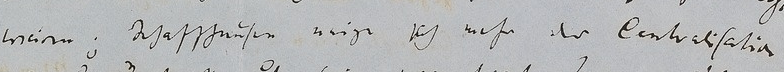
wären; Schaffhausen neige sich mehr der Centralisation
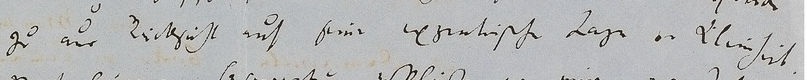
zu aus Rücksicht auf seine exzentrische Lage &. Kleinheit.
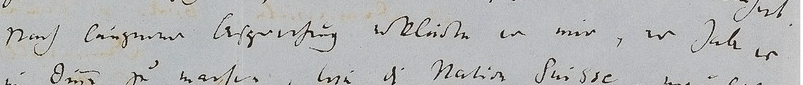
Nach längerer Besprechung erklärte er mir, er habe es
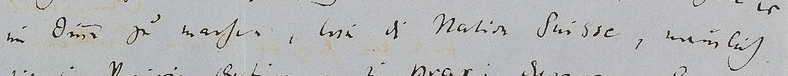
im Sinne zu machen, wie die Nation Suisse, nämlich
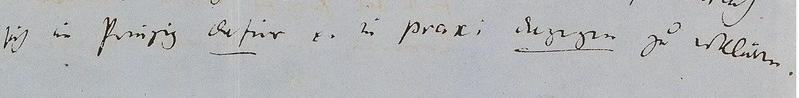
sich im Prinzip dafür &. in praxi dagegen zu erklären.
